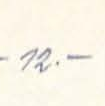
12.
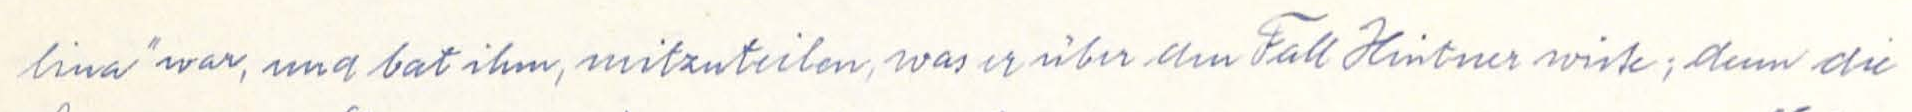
lina" war, und bat ihm, mitzuteilen, was er über den Fall Hintners wisse, denn die
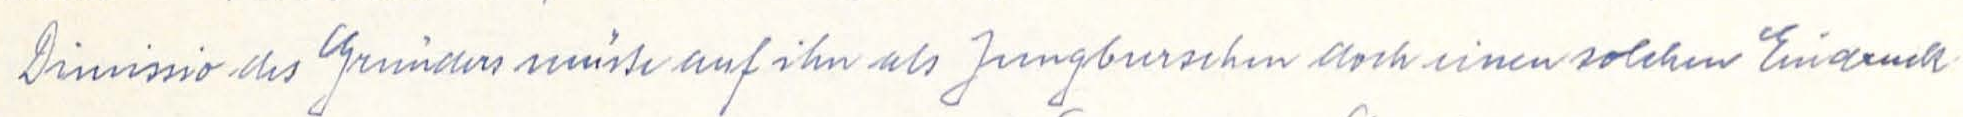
Dimissio des Gründer müsste auf ihn als Jungburschen dich einen solchen Eindruck
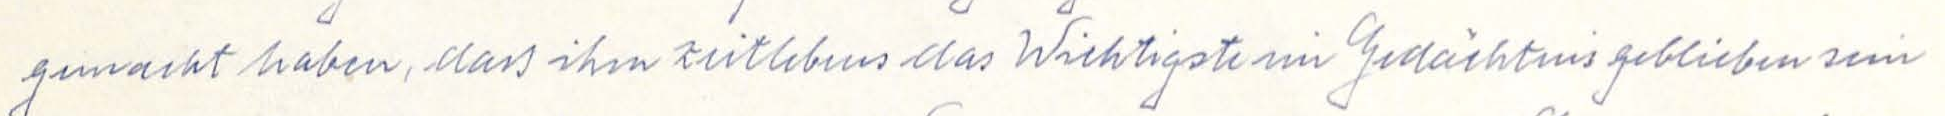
gemacht haben, dass ihm zeitlebens das Wichtigste im Gedächtnis geblieben sein
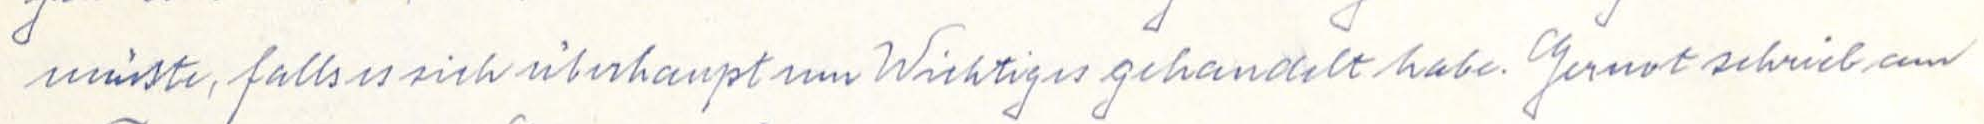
müsste, falls es sich überhaupt um Wichtiges gehandelt habe. Gernot schrieb am
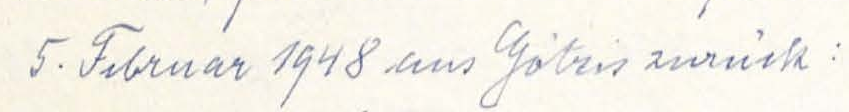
5. Februar 1948 aus Götzis zurück:
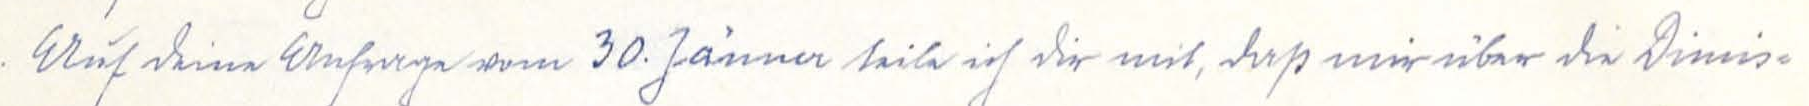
Auf deine Anfrage vom 30. Jänner teile ich dir mit, daß mir über die Dimis-
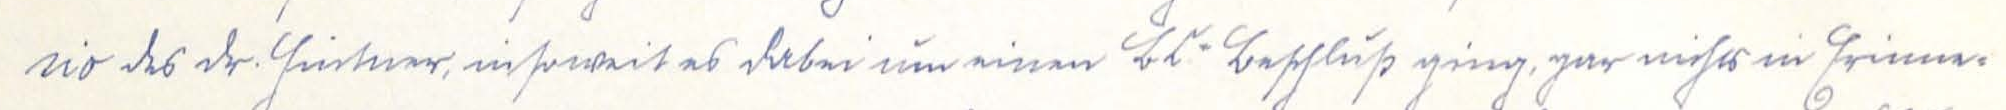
sio des Dr. Hintner, insoweit es dabei um einen BC-Beschluß ging, gar nichts in Erinn-
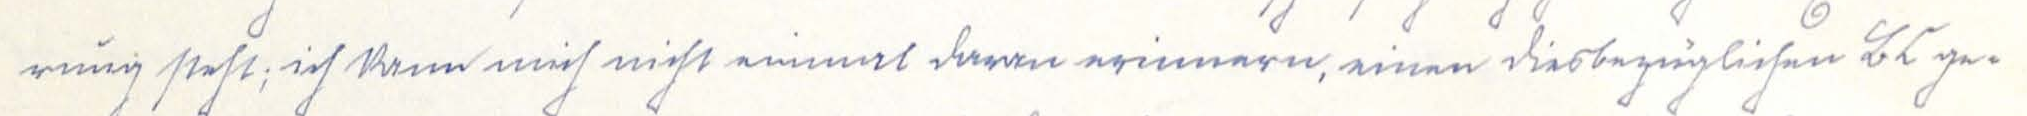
erung steht; ich kann mich nicht einmal daran erinnern, einen diesbezüglichen BC ge-
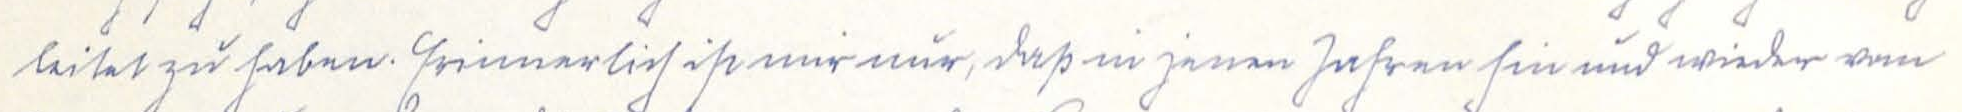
leitet zu haben. Erinnerlich ist mir nur, daß in jenen Jahren hin und wieder vom
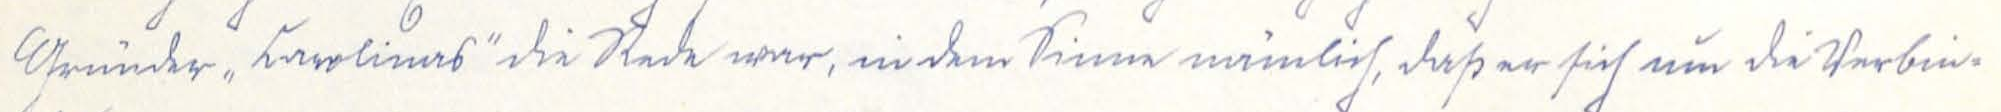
Gründer "Carolinas" die Rede war, in dem Sinne möglich, daß er sich um die Verbin-
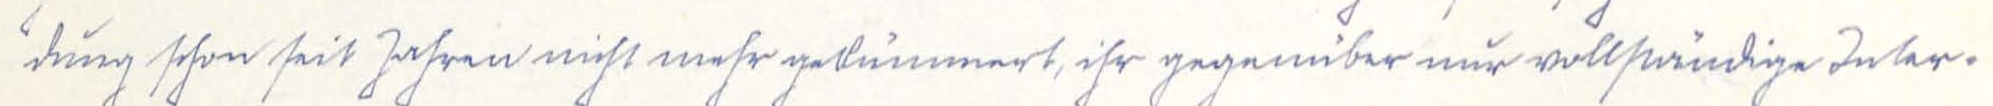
dung schon seit Jahren nicht mehr gekümmert, ihr gegenüber nur nur vollständige Inter-
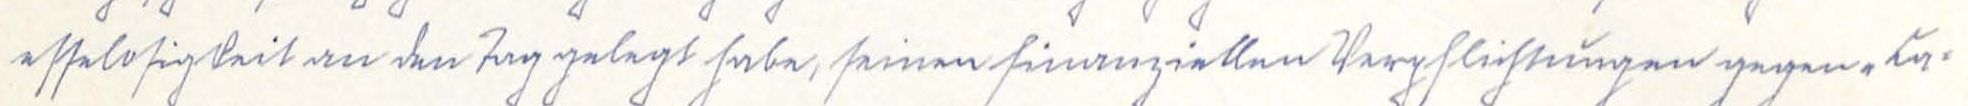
esselosigkeit an den Tag gelegt habe, seinen finanziellen Verpflichtungen gegen "Ca-
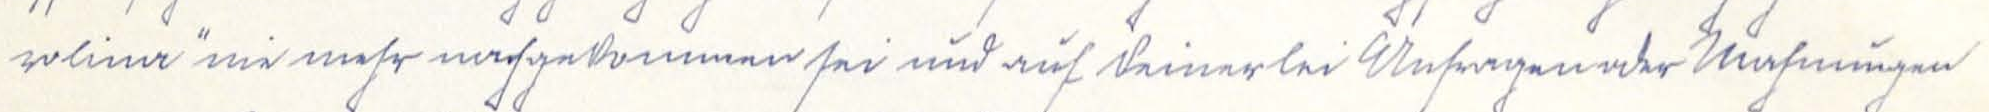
rolina" nie mehr nachgekommen sei und auf keinerlei Anfragen oder Mahnungen
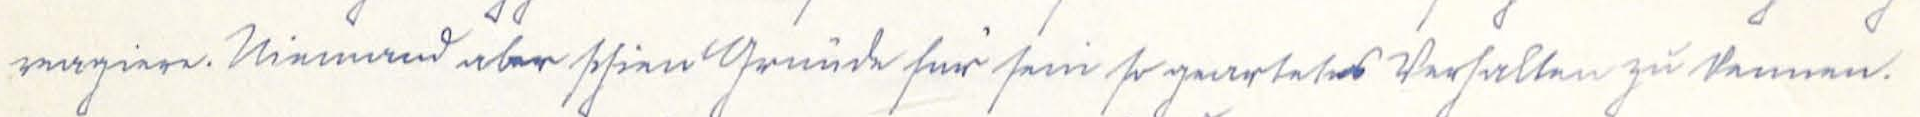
reagiere. Niemand aber schien Gründe für sein so geartetes Verhalten zu kennen.
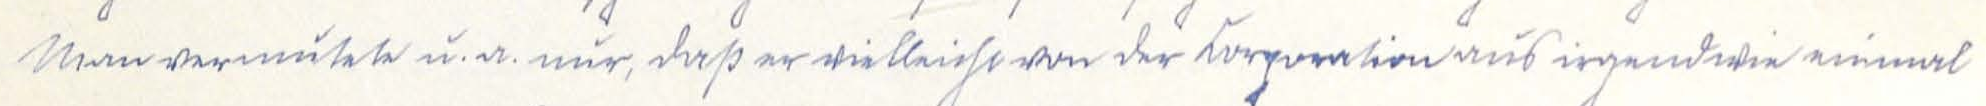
Man vermutete u. a. nur, daß er vielleicht von der Corporation aus irgendwie einmal
